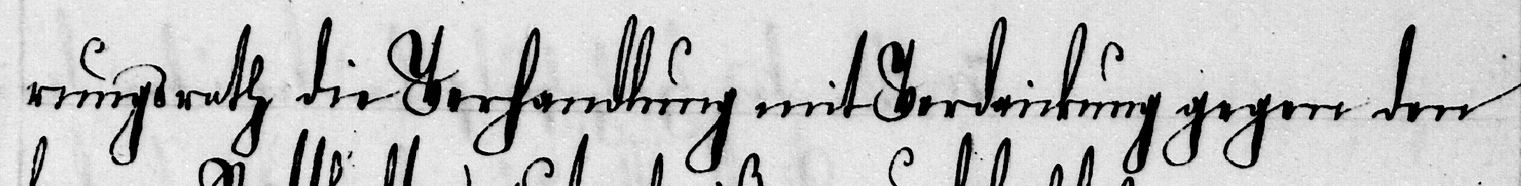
rungsrath die Verhandlung mit Verdankung gegen den
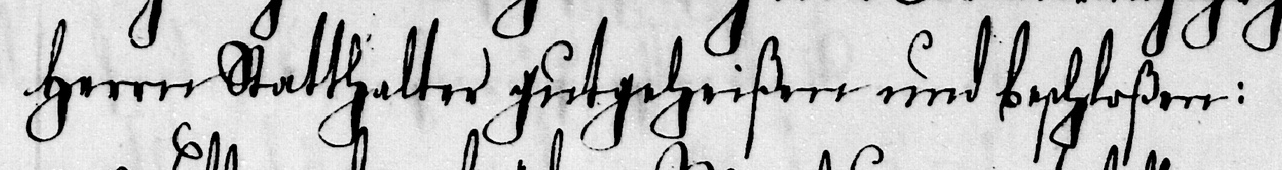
Herrn Statthalter gutgeheißen und beschloßen:
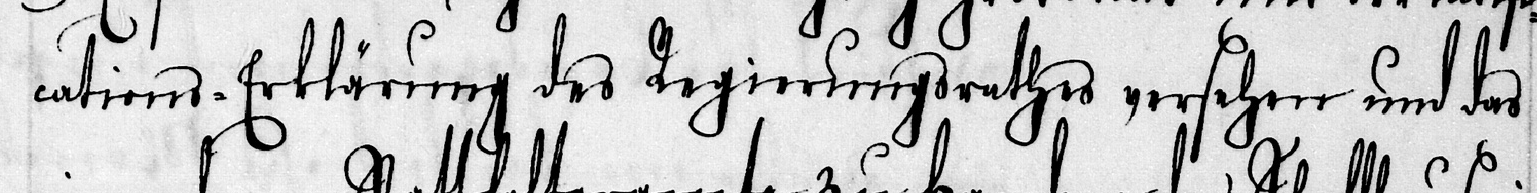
ications-Erklärung des Regierungsrathes versehen und das
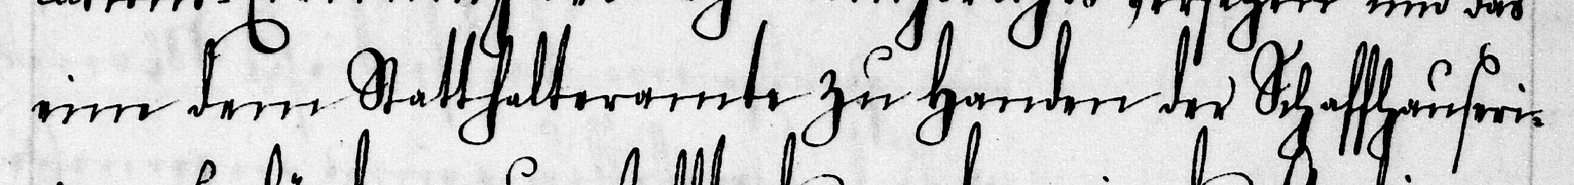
eine dem Statthalteramte zu Handen der Schaffhauseri¬
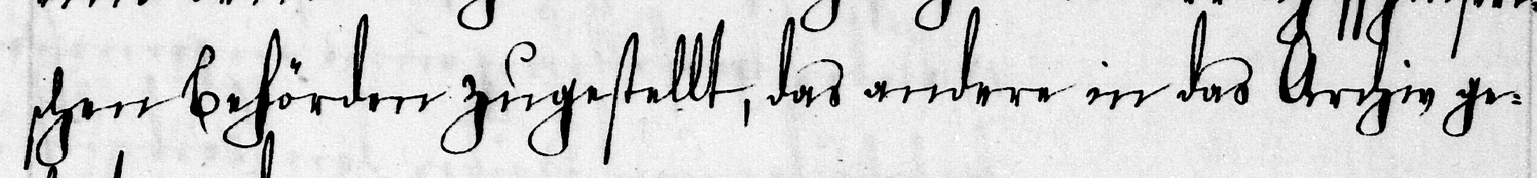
schen Behörden zugestellt, das andere in das Archiv ge¬
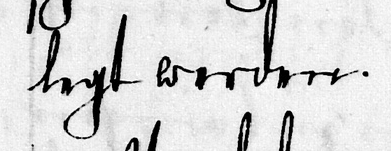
legt werden.
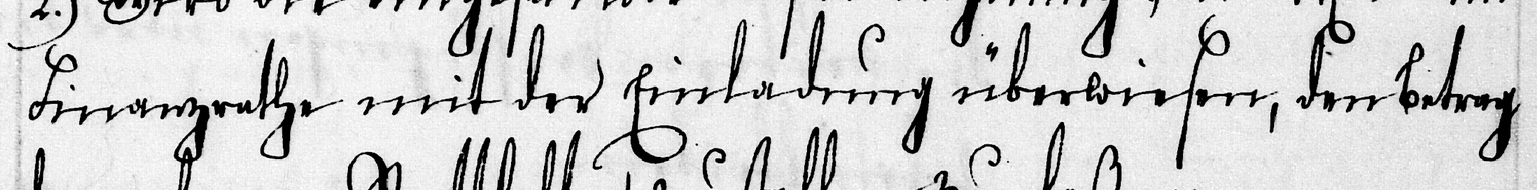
Finanzrathe mit der Einladung überwiesen, den Betrag
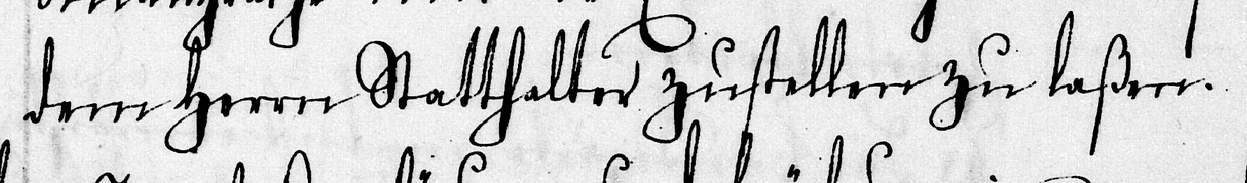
dem Herrn Statthalter zustellen zu laßen.
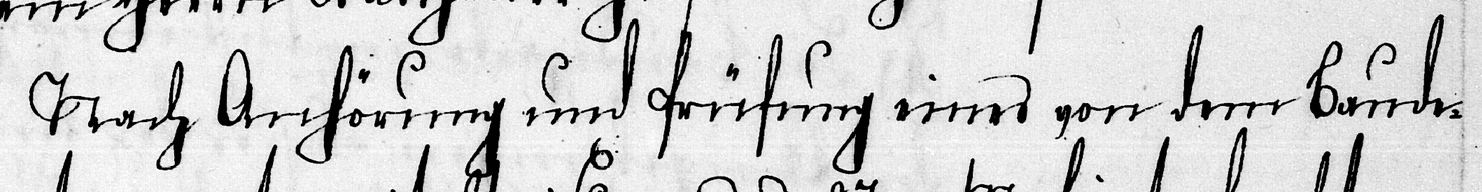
Nach Anhörung und Prüfung eines von dem Baude¬
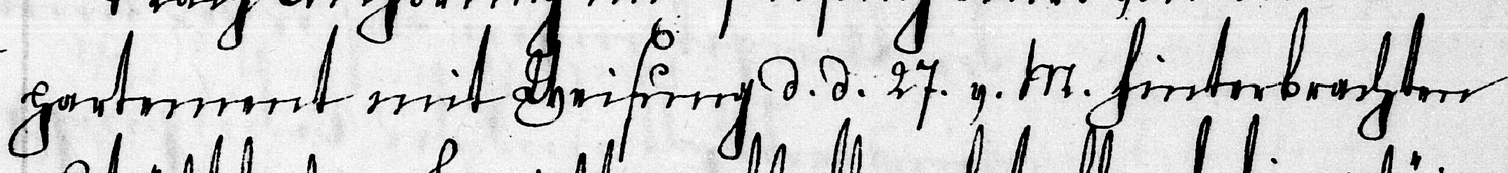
partement mit Weisung d. d. 27. v. M. hinterbrachten
